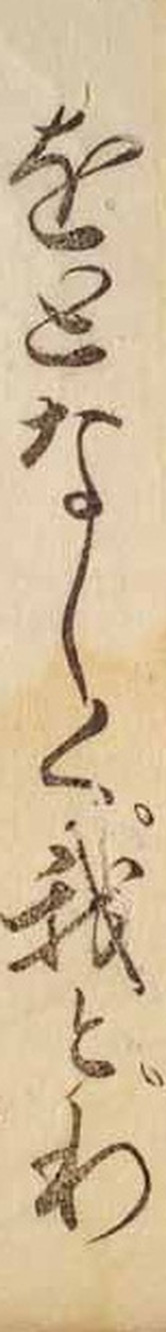をとなしく。我と。わ
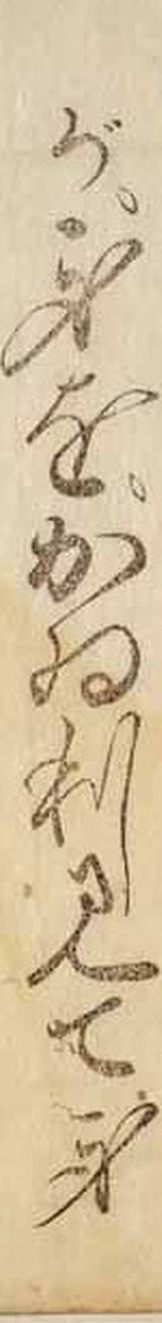が。身を。かゐり見て。身
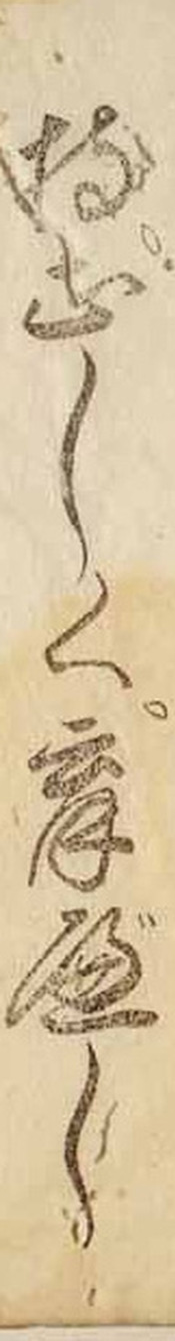持。正しく。育べし
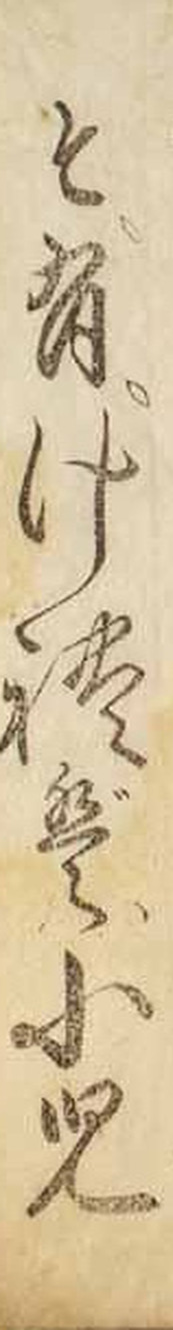と有。ければ小児

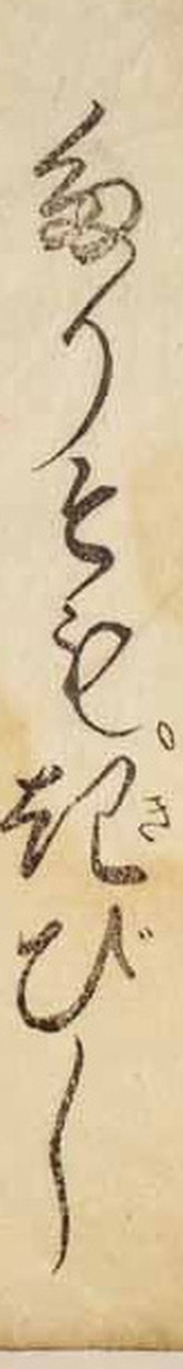たりとも。起びし
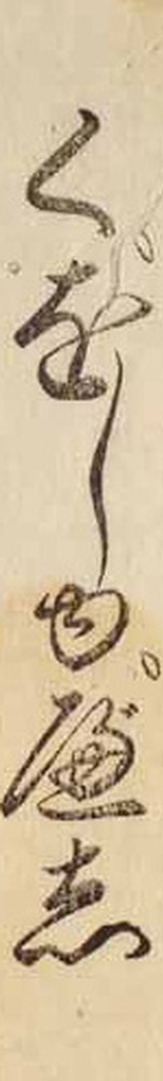く。をしゆ。べし
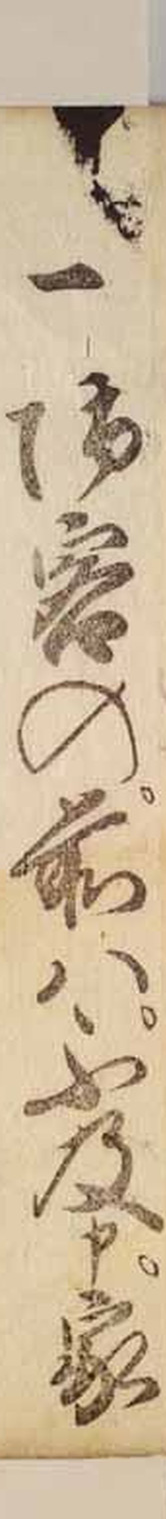一御客の。前は。不及申。家
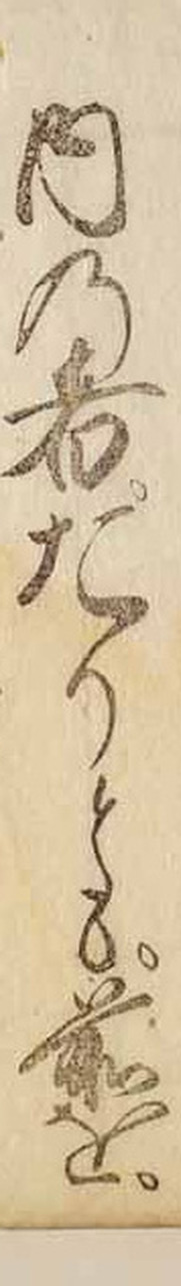内の者。たりとも。前を。
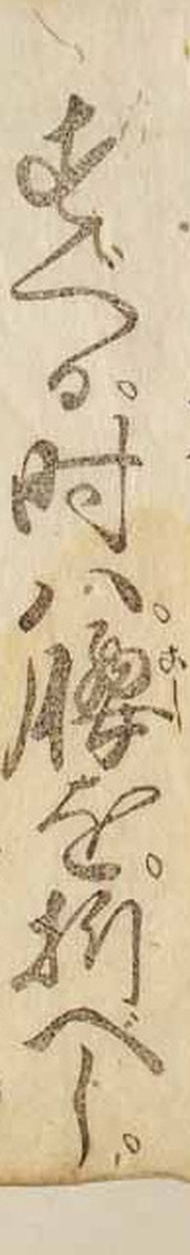すべる。時は腰を。折べし。
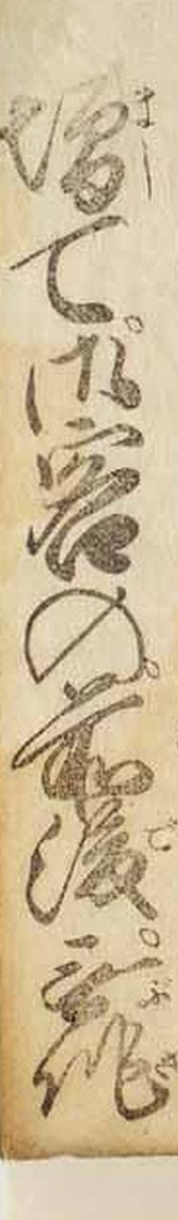増て。御客の。前後。無作

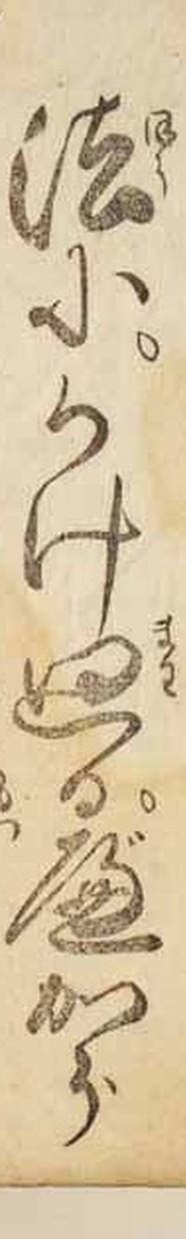法に。かけ廻る。べから
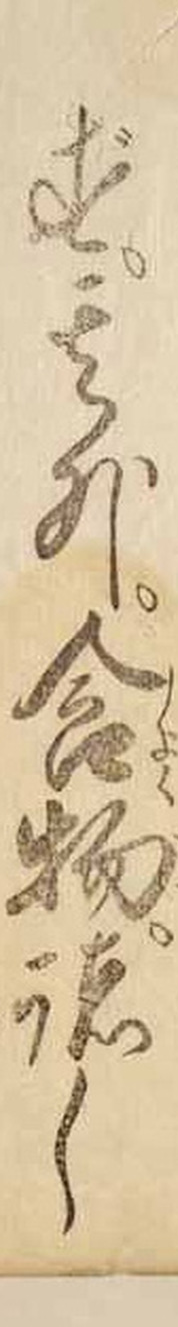ず。其外。食物。諸し
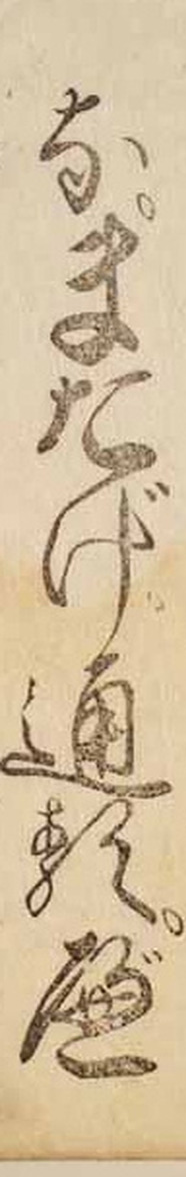な。またげ。通る。べ
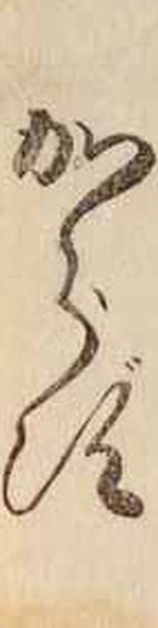からず
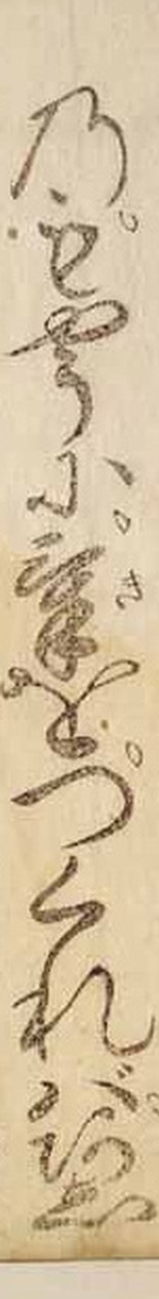の。もやうに。気を。つくれば。あし
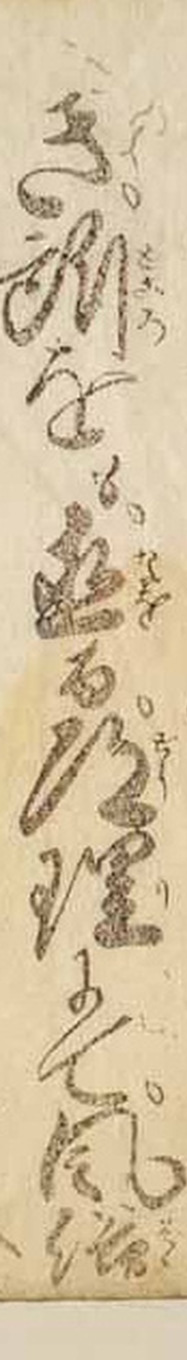き。所をも。直る。道理にて。風俗
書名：寺子躾方
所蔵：東京学芸大学教育コンテンツアーカイブ
